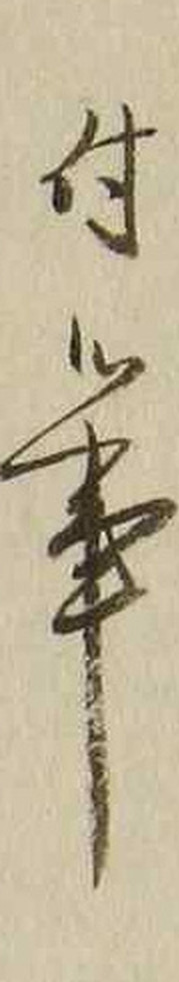付候事
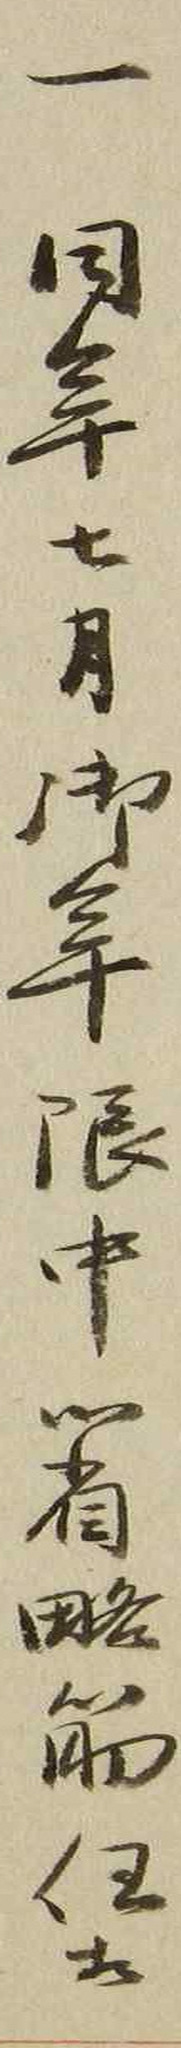一同年七月御年限中御省略筋任相
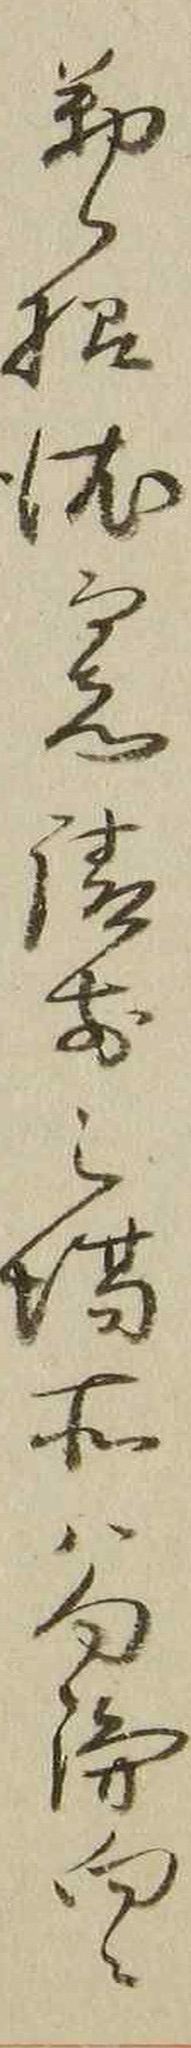勤候様依而者請前之場所ハ勿論向々
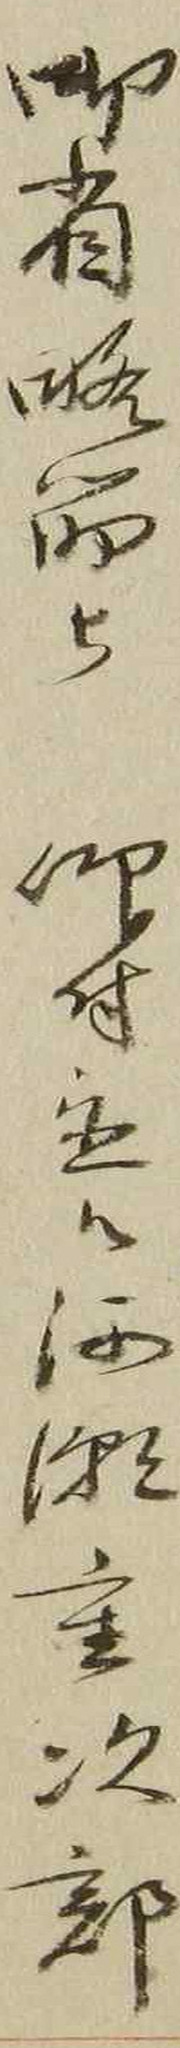御省略筋被仰付置候河瀬重次郎
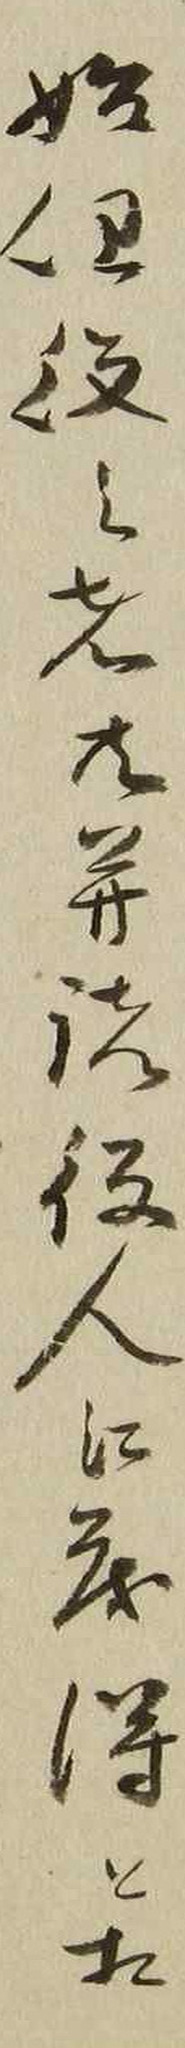始組役之者共并諸役人江茂得と相
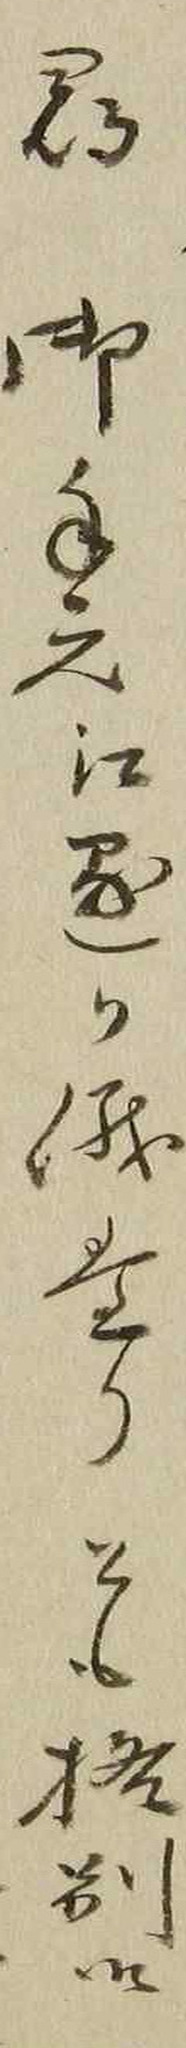尋御手元江懸り俄たりとも格別御
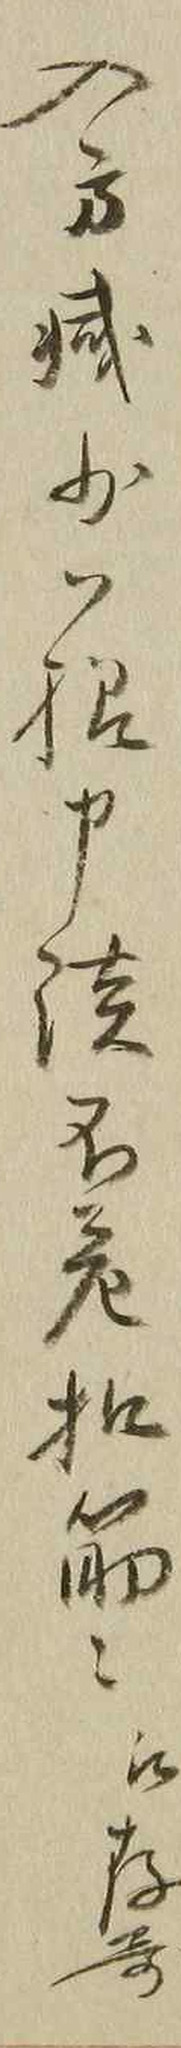入方減少候様申談不差扣筋々江存寄
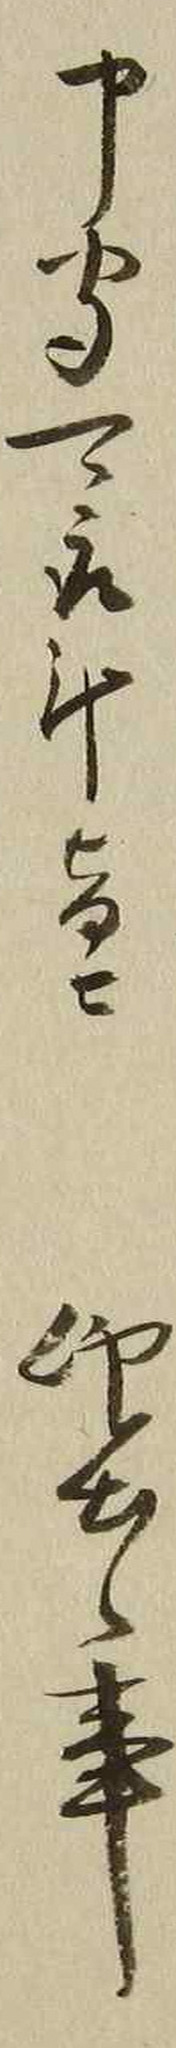申聞可取計旨被仰出候事
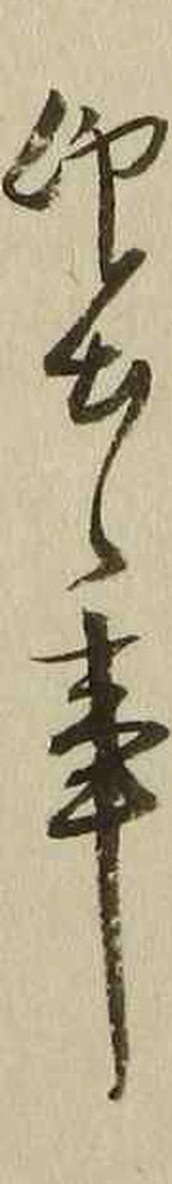仰出候事
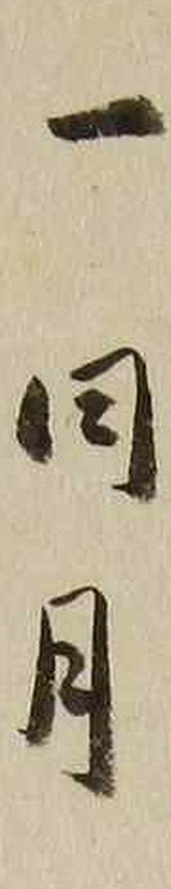一同月
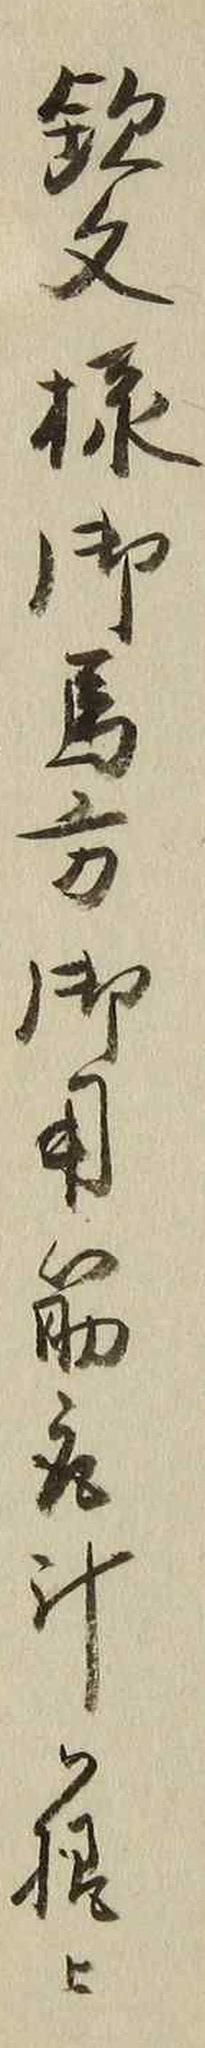欽文様御馬方御用筋取計候様被
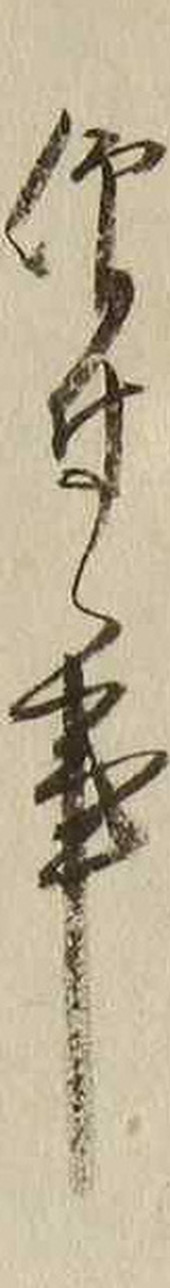仰付候事
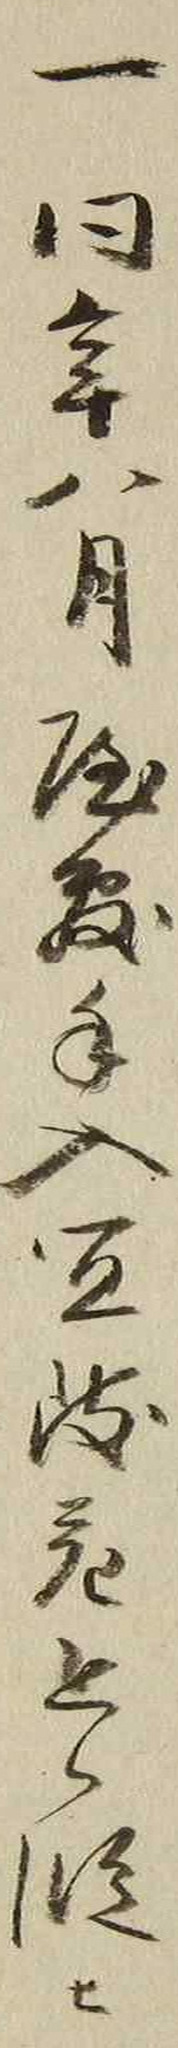一同年八月屋敷手入宜致差上候段被
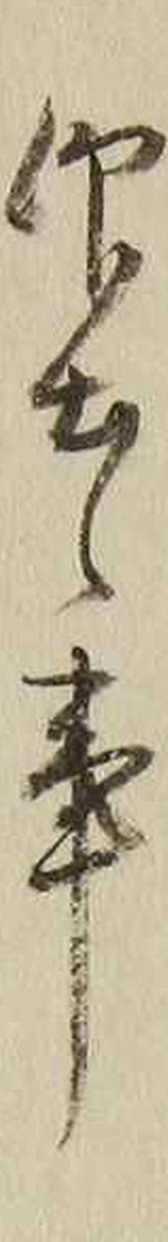仰出候事
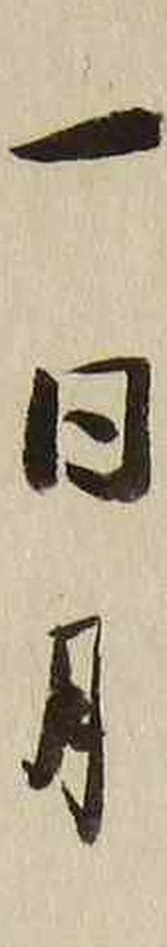一同月
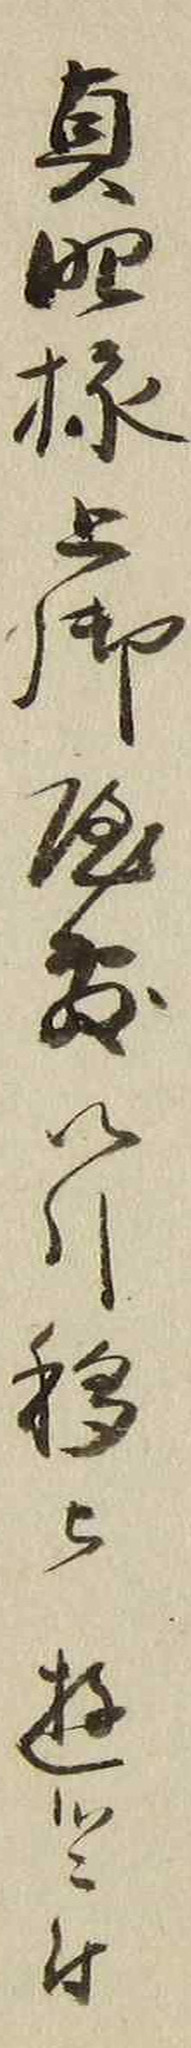真昭様上御屋敷御引移被遊候ニ付
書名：諸士系譜　巻之261　あ之部14
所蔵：会津若松市立会津図書館
